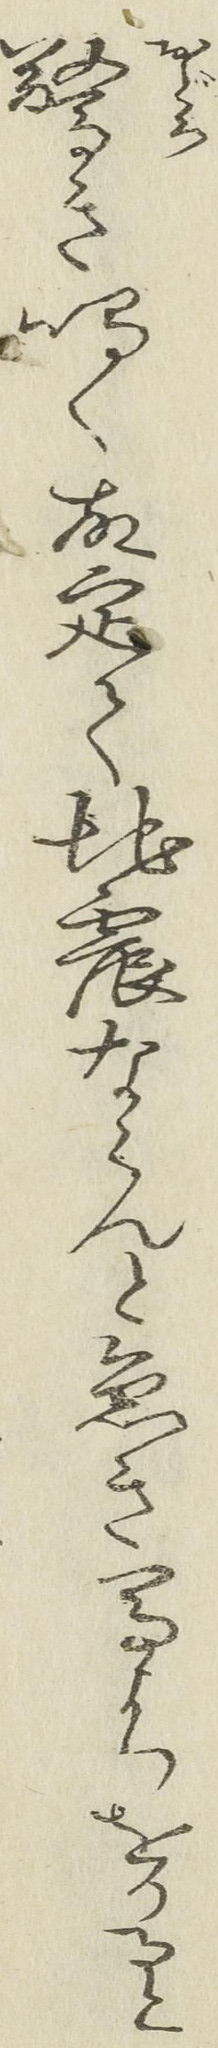驚き鳴く故定めて地震ならんと急き馬よりをりると
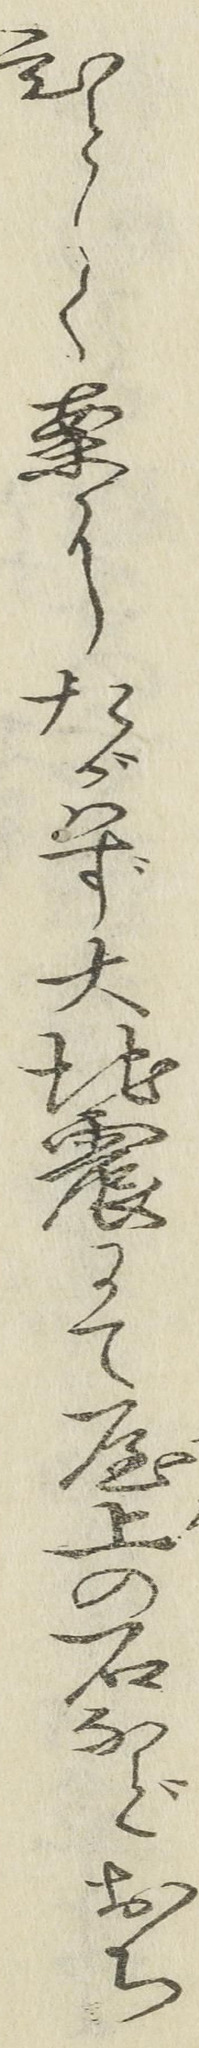至りて案にたがわず大地震にて屋根の石などおち
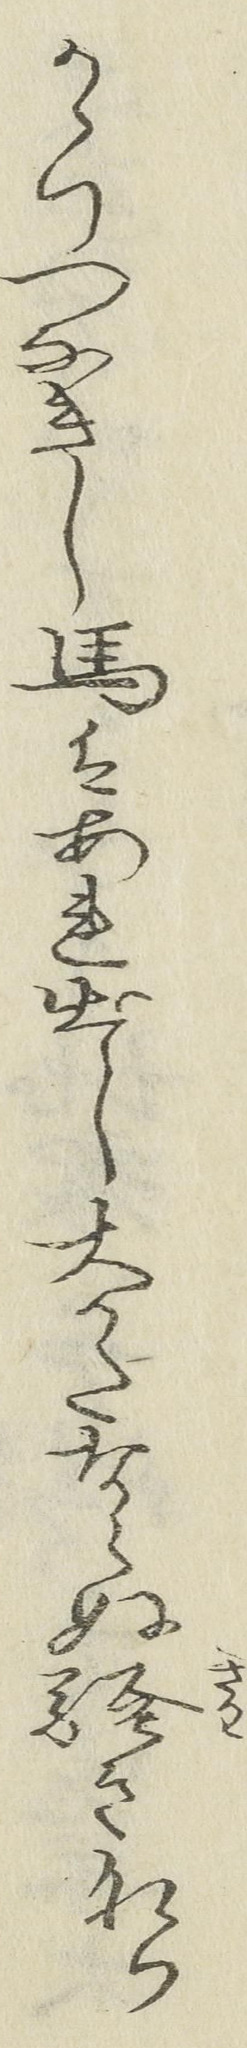けりつなきし馬はあれ出し大かたならぬ騒きなり
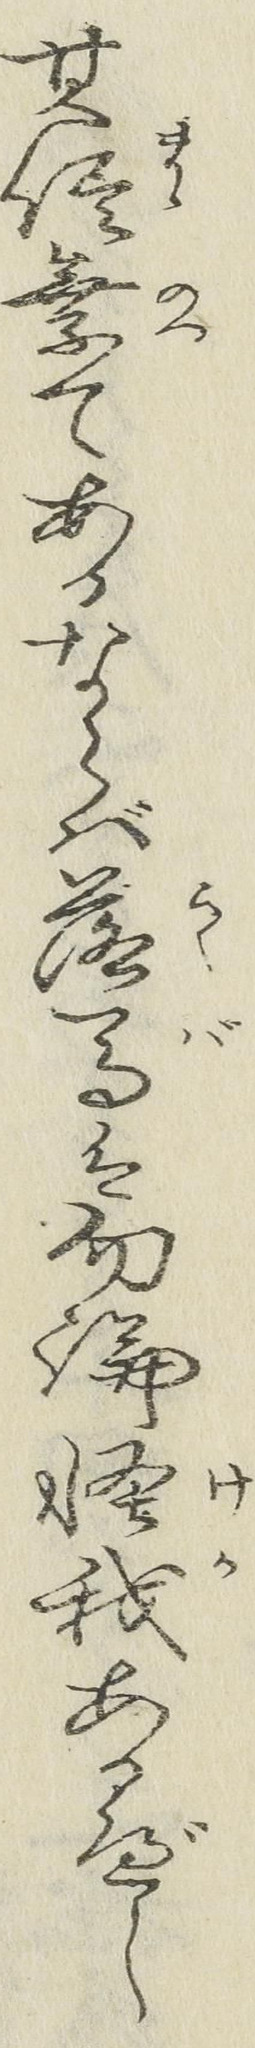其儘乗てあるならば落馬は勿論怪我あるべし
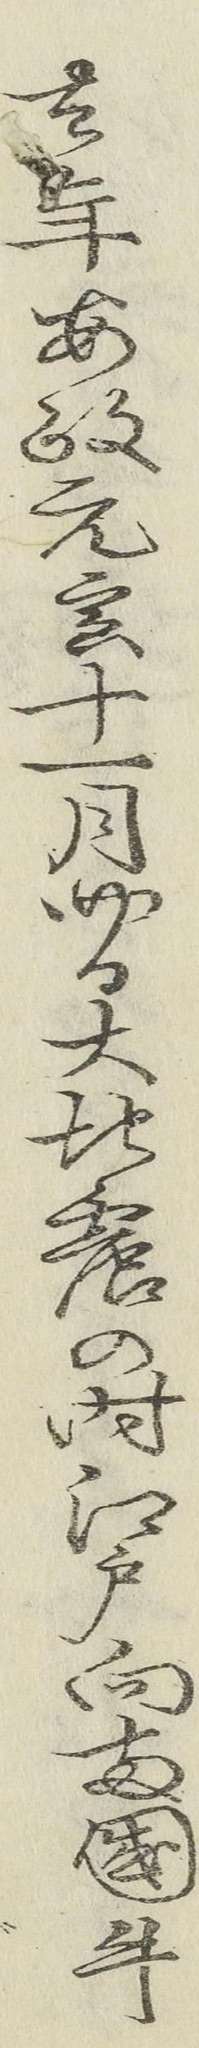〇去年安政十一月四日大地震の時江戸向両国牛
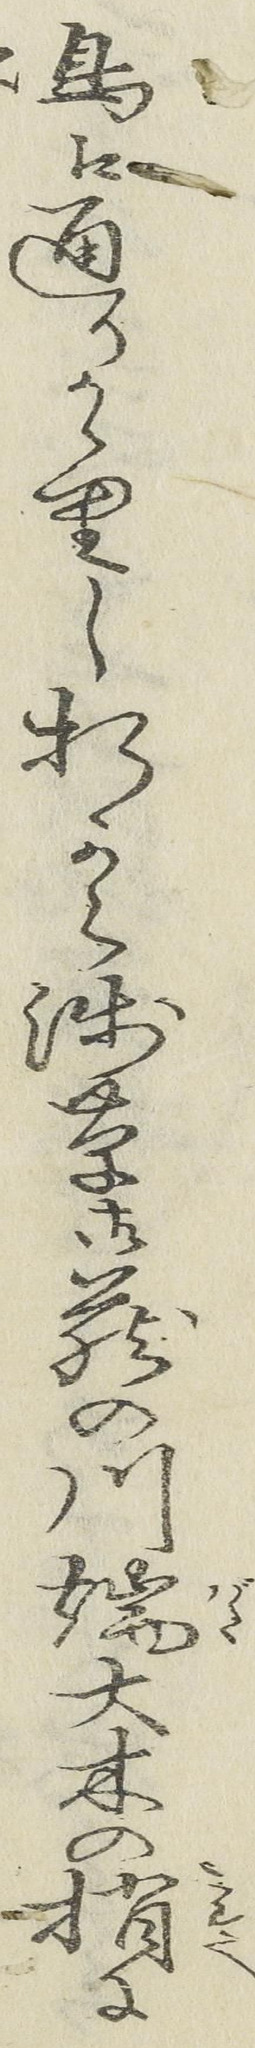嶋に通りかゝりし折から浅草御蔵川端大木の梢に
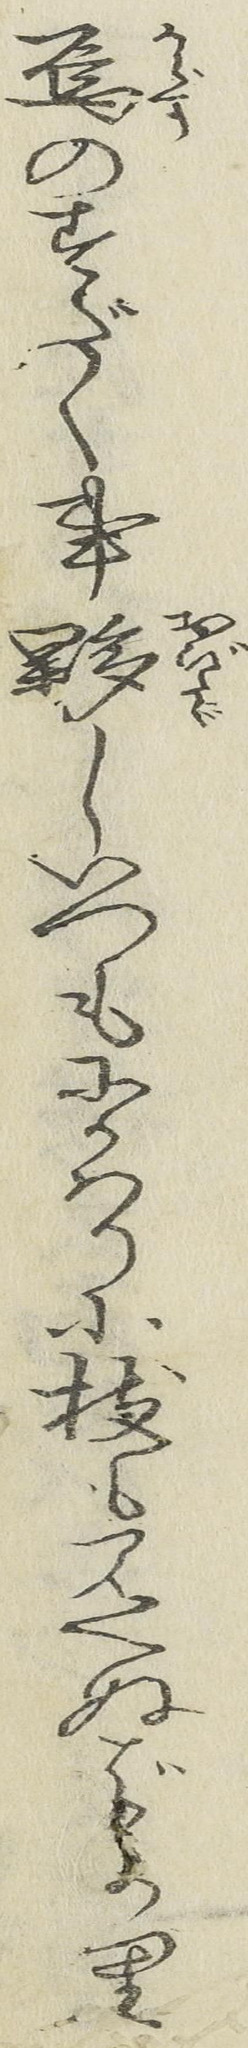烏のはゞたく事夥しいつもにかはり小枝も見へぬばかり

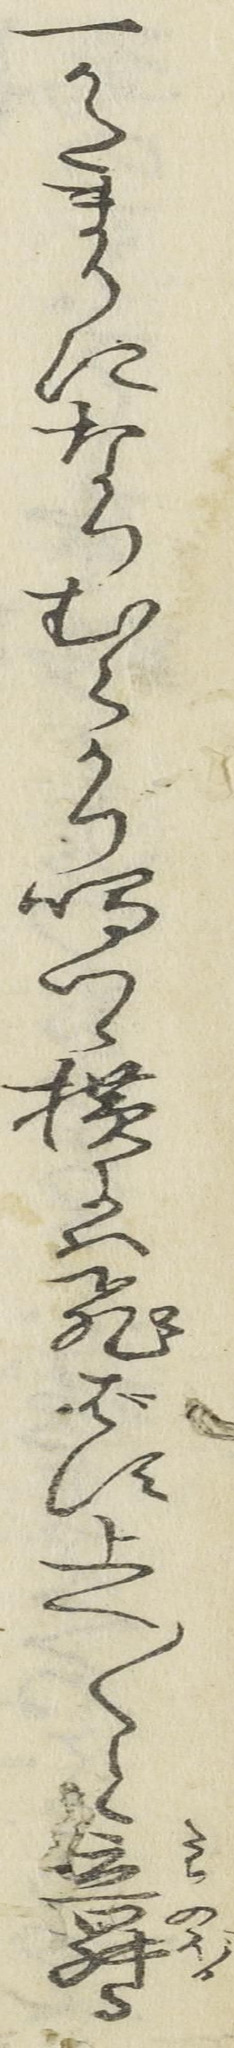かたまりになりむらかり鳴つゝ横には飛ばず上へ〳〵と立昇る
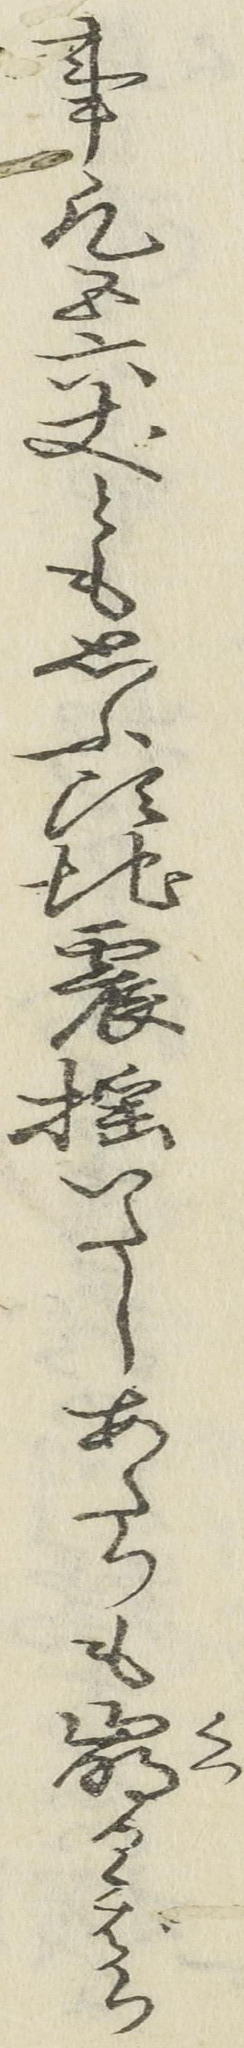事凡五六丈とも思ふ頃地震揺いたしあたりも崩るゝばかり
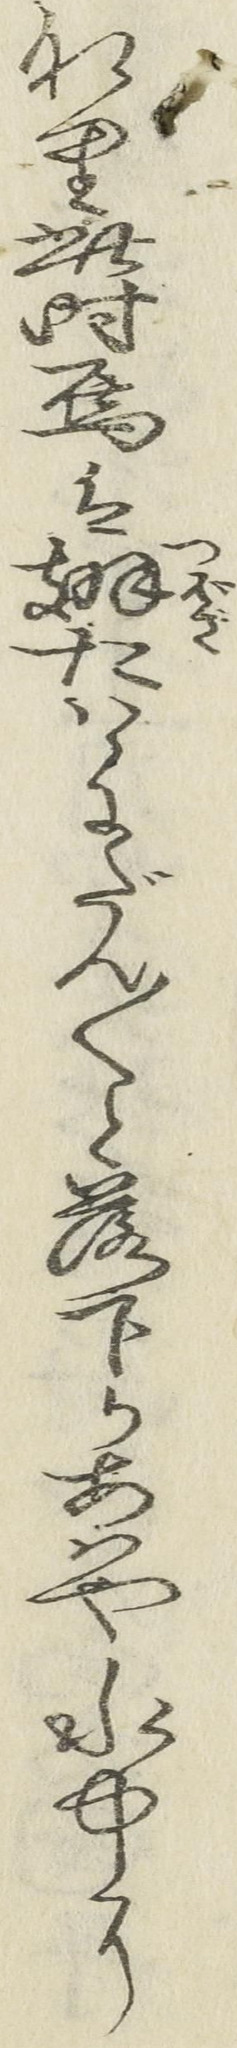なり此時烏は翅たはゝにだん〳〵と落下りあはや水中に
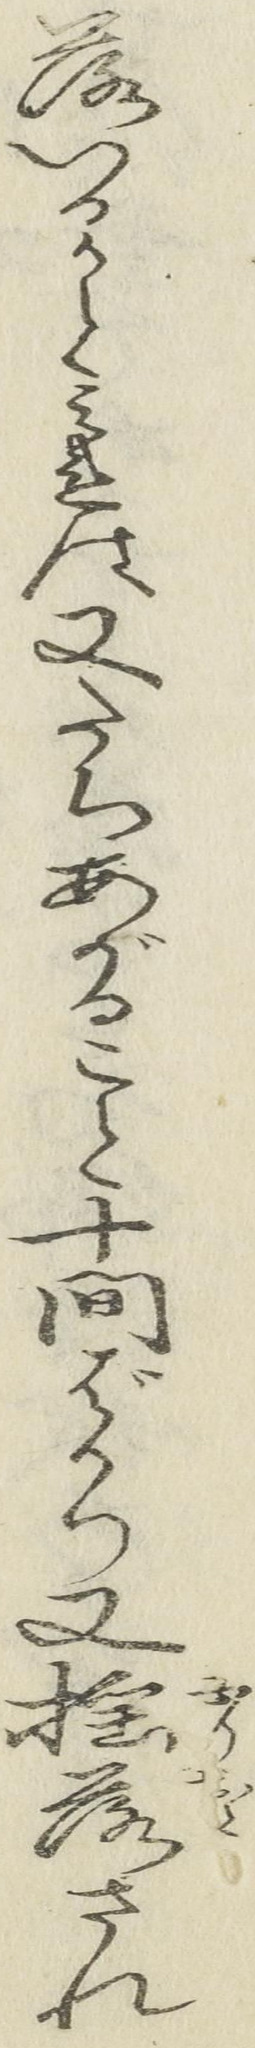落いるかとみれは又たちあがること十間ばかり又揺落され
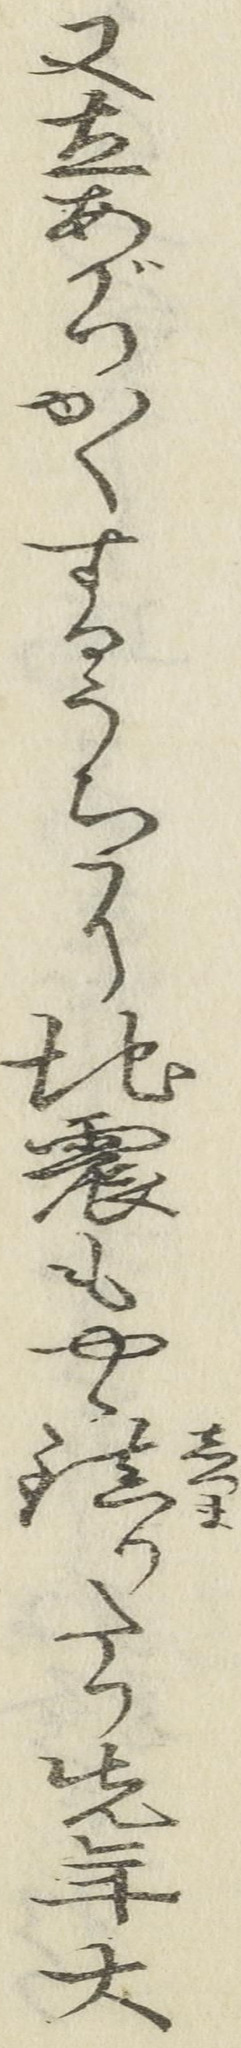又立あがりかくするうちに地震もやゝ鎮りたり先年大
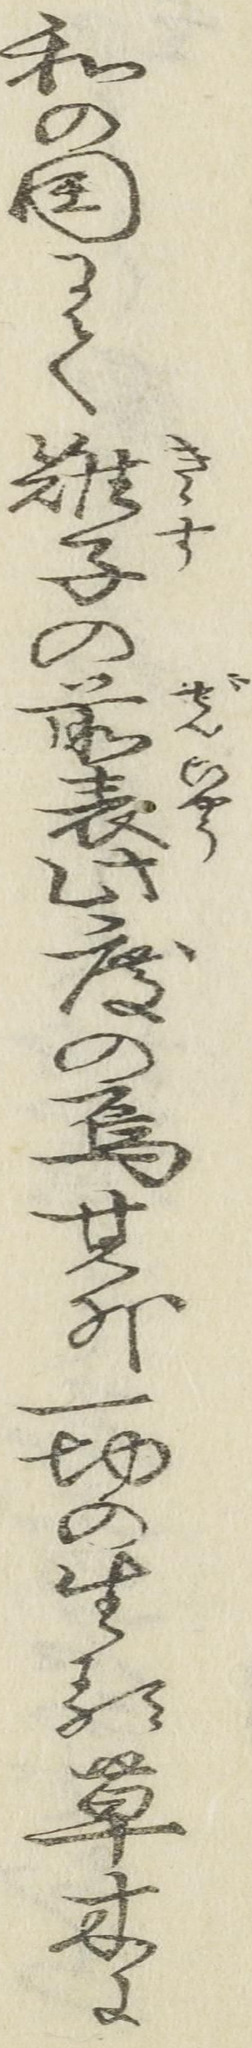和の国にて雉子の前表此度の烏其他一切の生類草木に
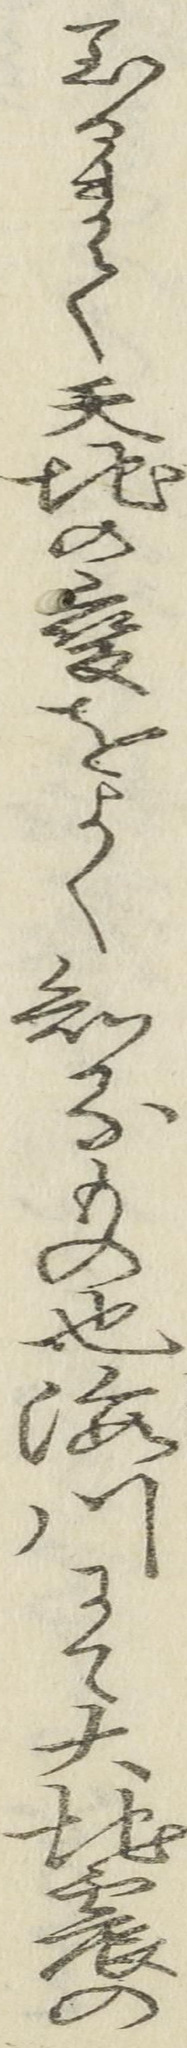至るまて天地の変をよく知るもの也海川にて大地震の
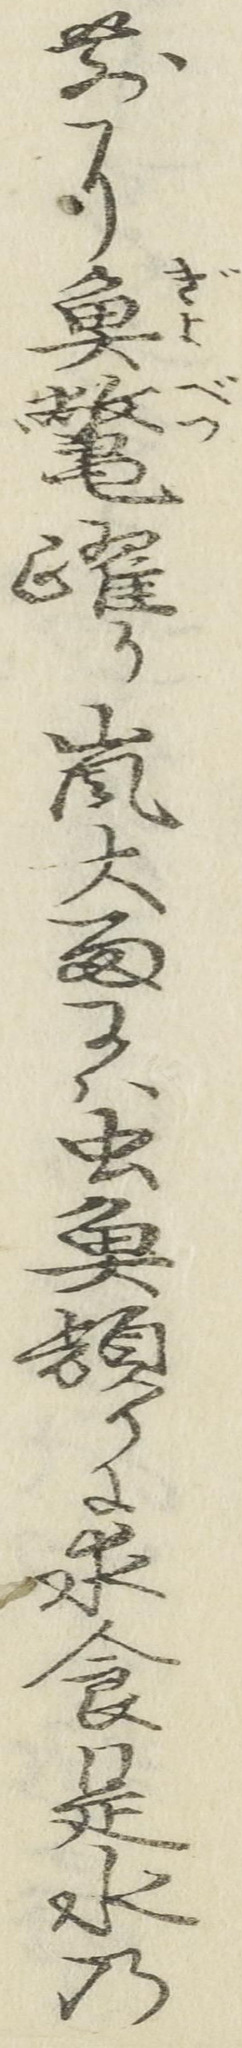前に魚鼈確に嵐大雨には虫魚頻りに氷食是水乃
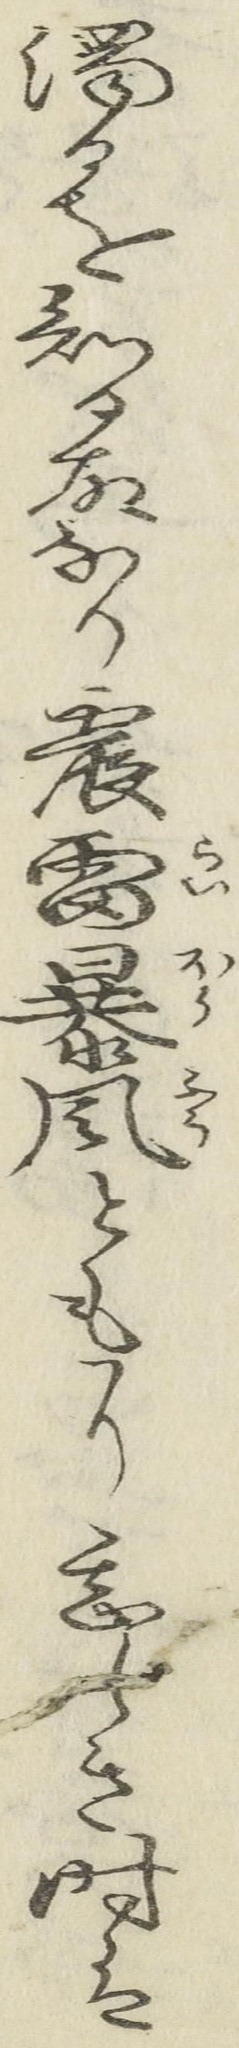濁るを知る故なり震雷暴風ともに甚しき時は
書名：震雷考説　全
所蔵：東京大学地震研究所図書室 Earthquake Research Institute Library, The University of Tokyo, JAPAN
